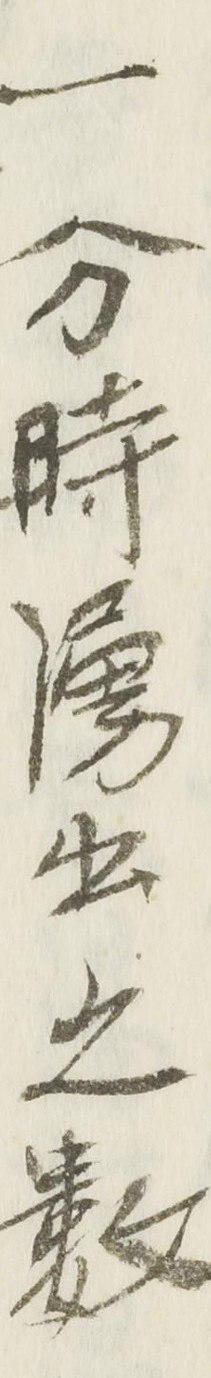一分時湧出之数
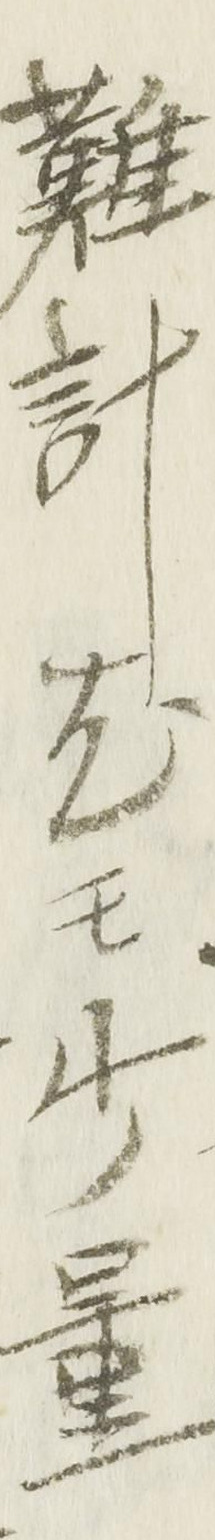難計尤モ少量
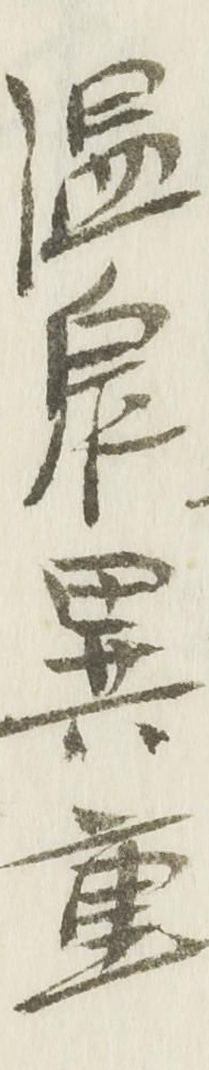温泉異重
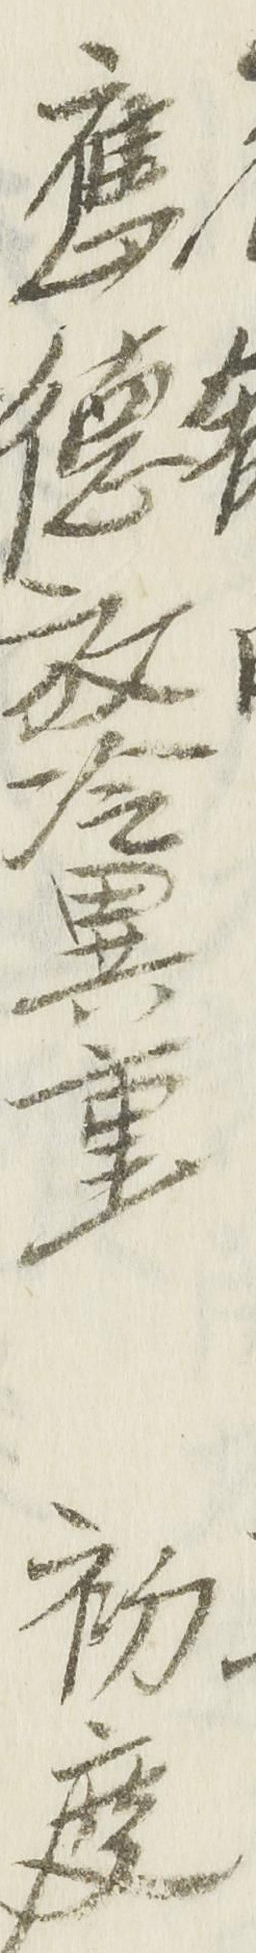応徳放冷異重初度
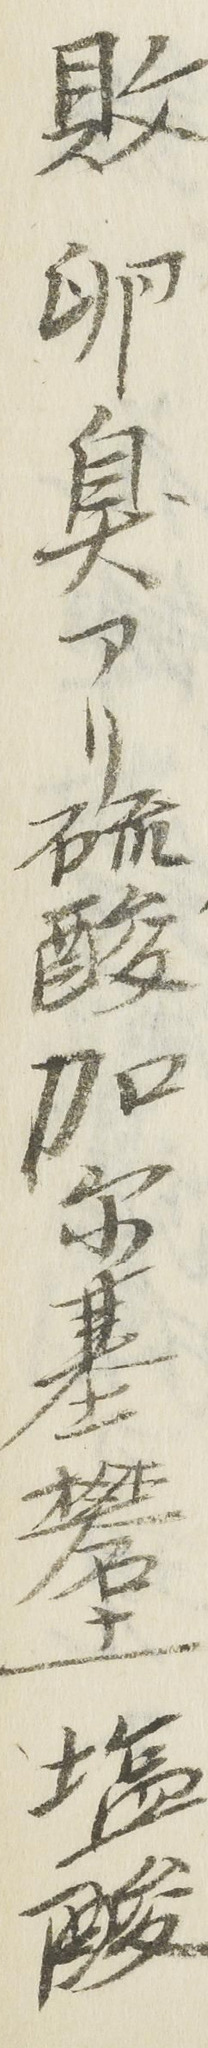敗卵臭アリ硫酸加尓基礬土塩酸

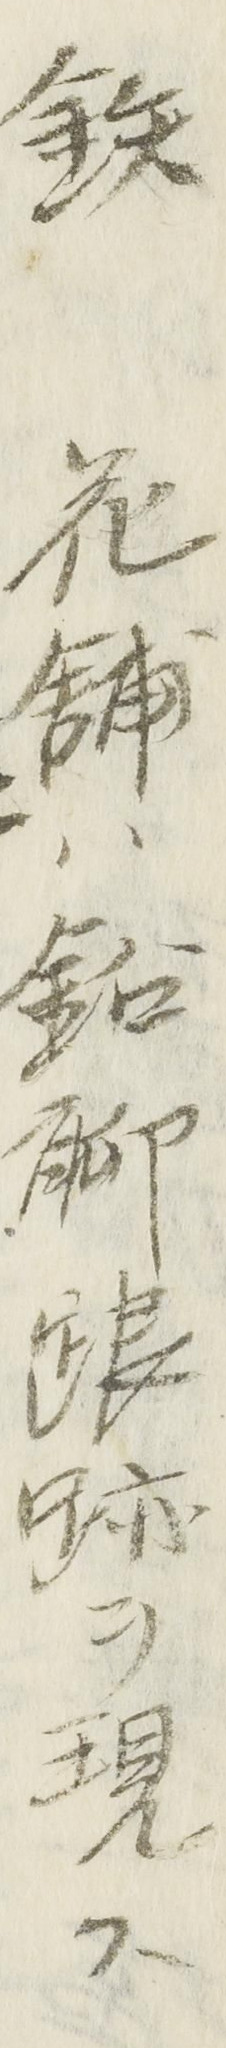鉄花鋪ハ鉛聊銀跡ヲ現シ
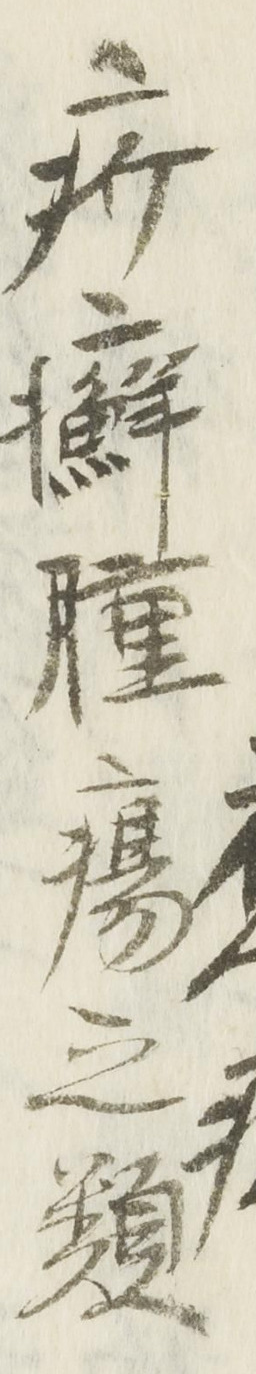疥癬腫瘍之類
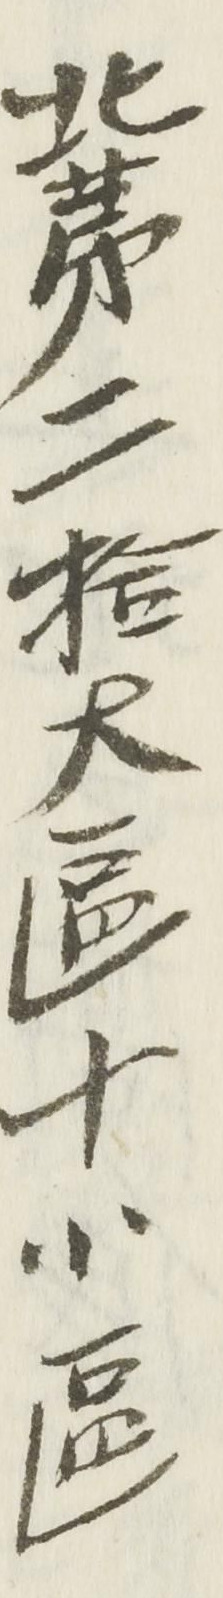北第二拾大区十小区
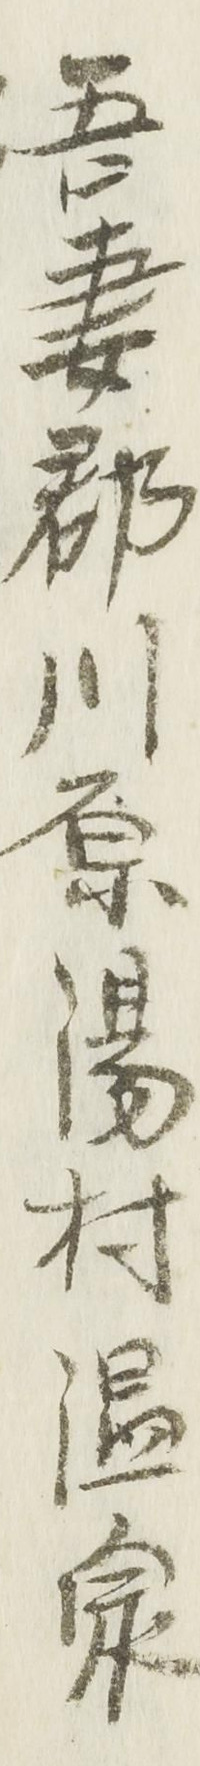吾妻郡河原湯村温泉
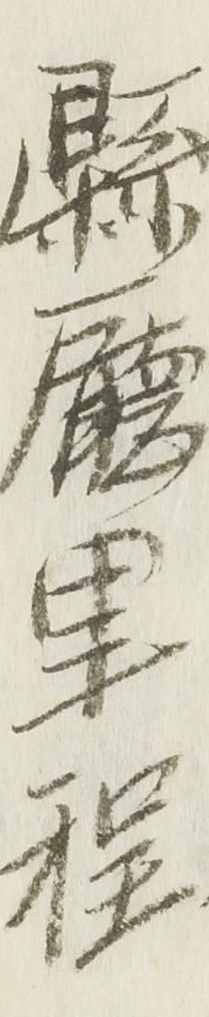県庁里程
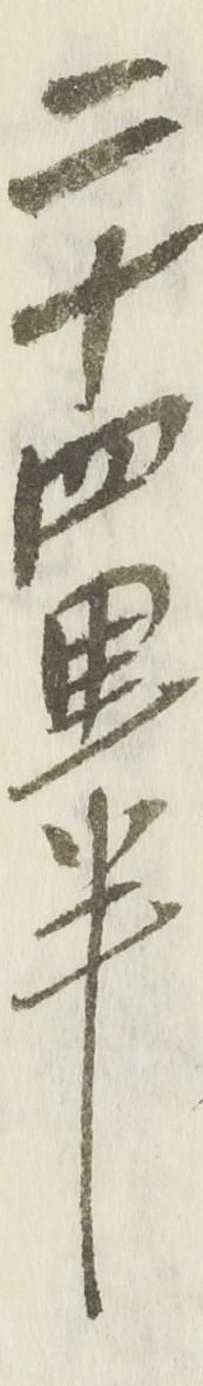二十四里半
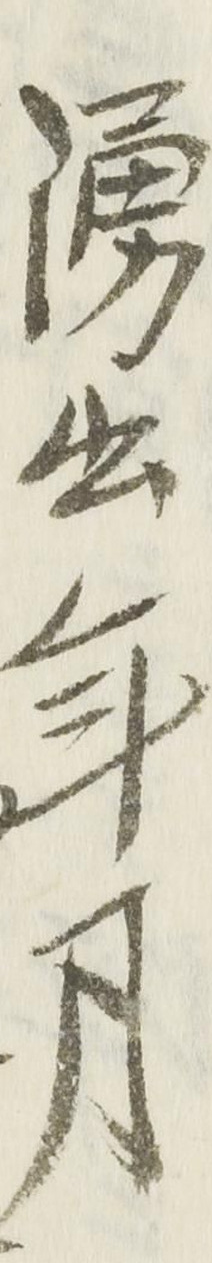湧出年月
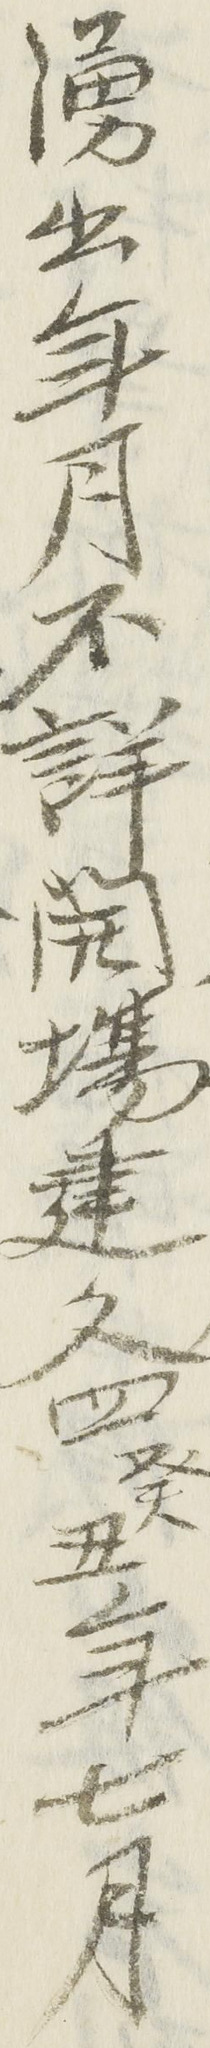湧出年月不詳開場建久四癸丑年七月
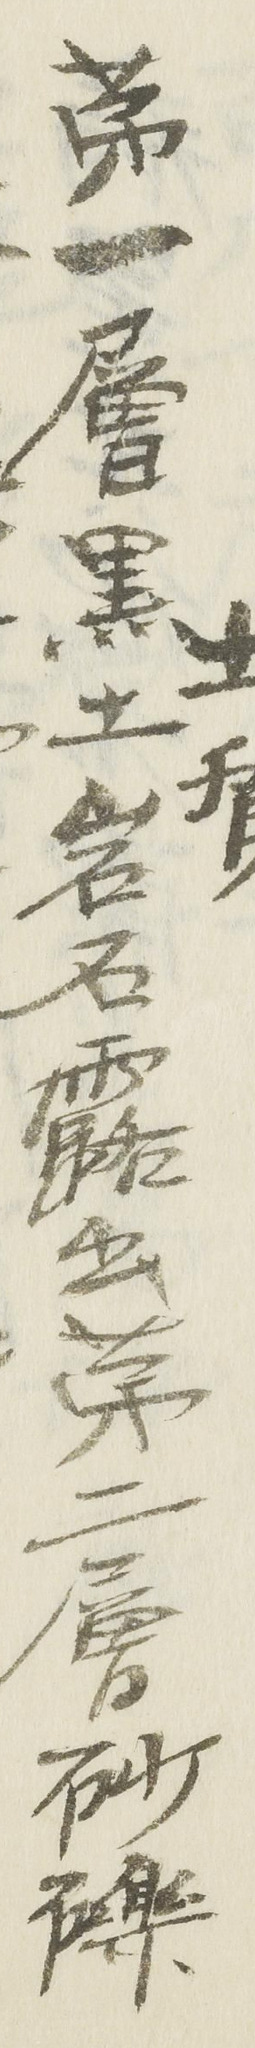第一層黒土岩石露出第二層砂礫
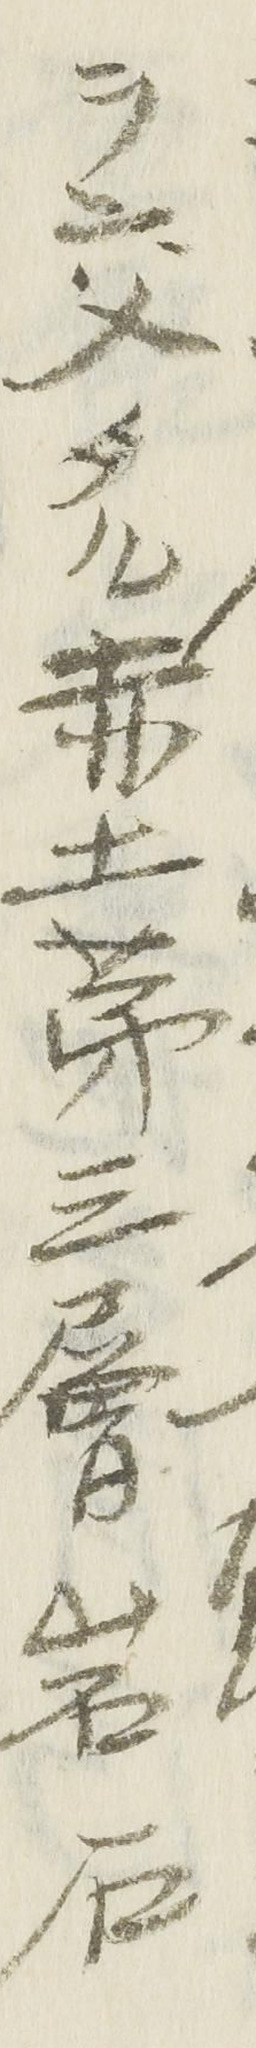ヲ交タル赤土第三層岩石
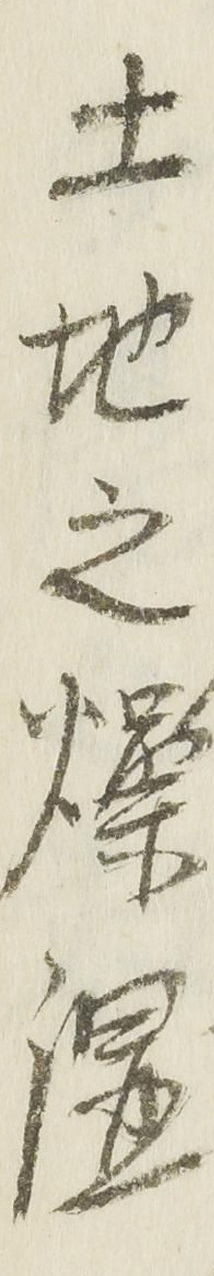土地之燥湿
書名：温冷泉試験表
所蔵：東京大学地震研究所図書室 Earthquake Research Institute Library, The University of Tokyo, JAPAN
